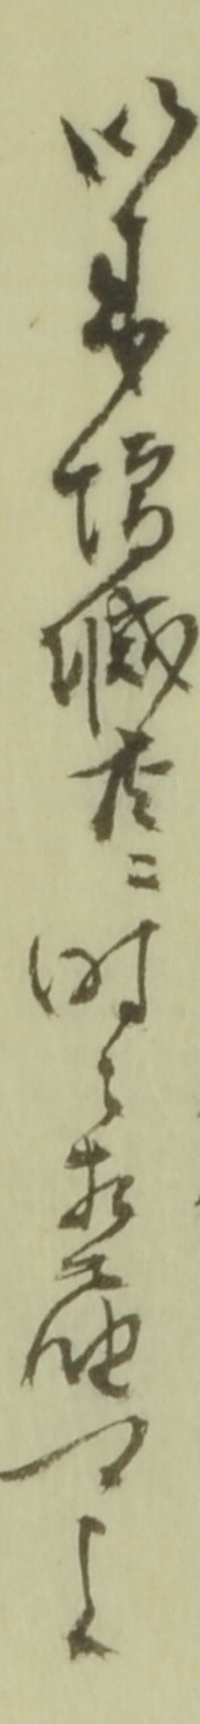以来増減共二時々相届可申候
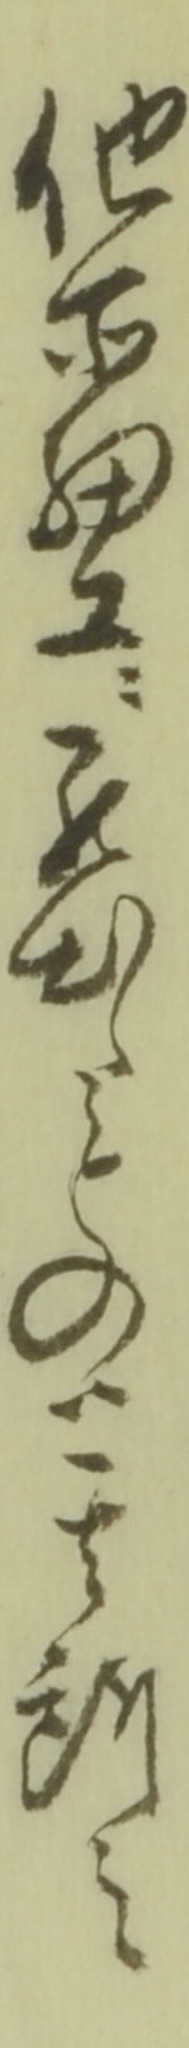他所留主二罷出候ものハ其所之
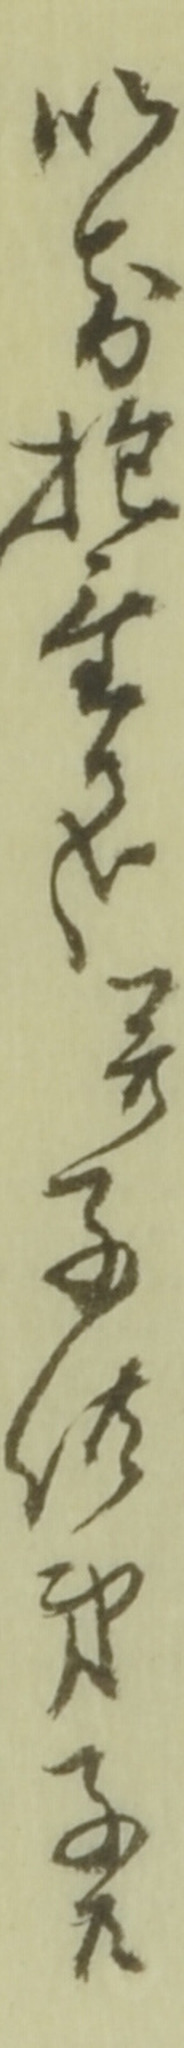以前抱置候哉並子供弟子共
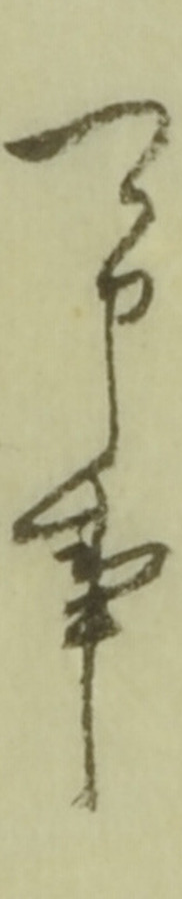可申事
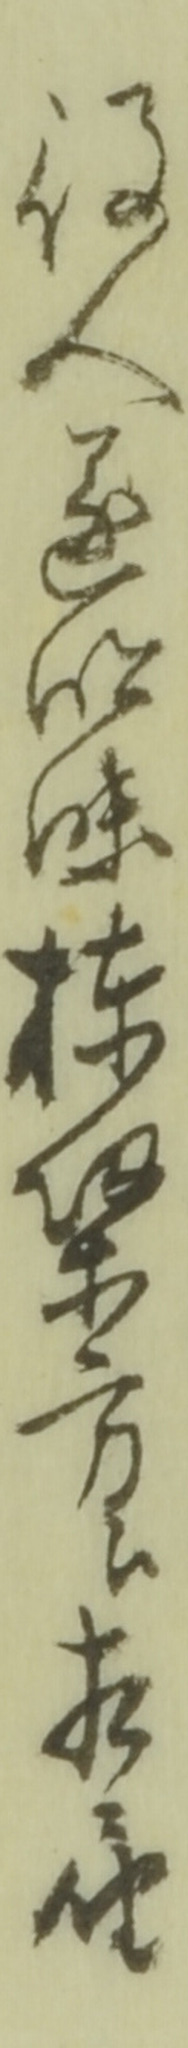役人遂吟味棟梁方え相届
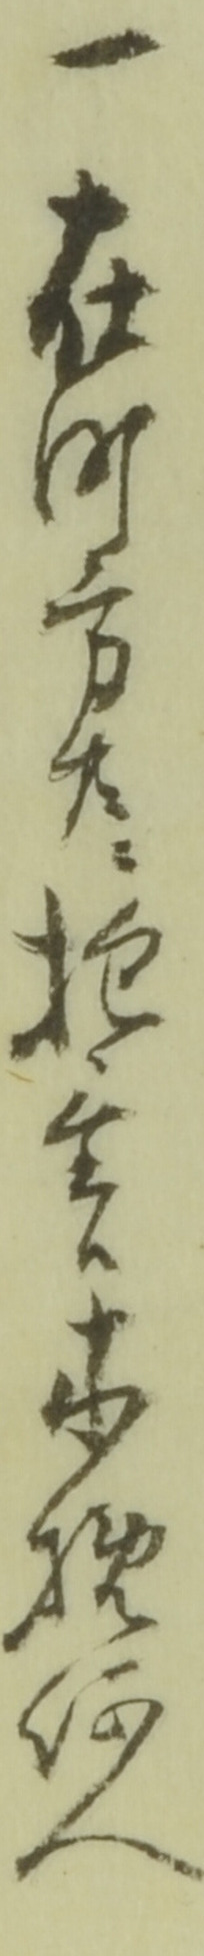一在町方共抱置候木挽何人
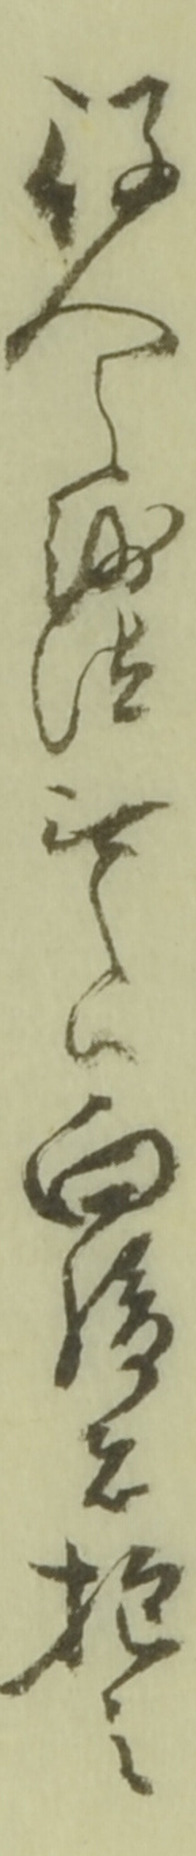役人の趣汰無之候向後者抱之

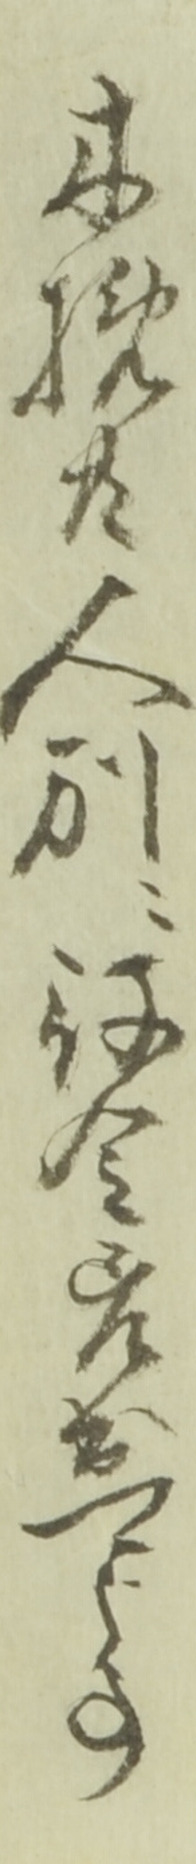木挽共人別二役金差出可申事
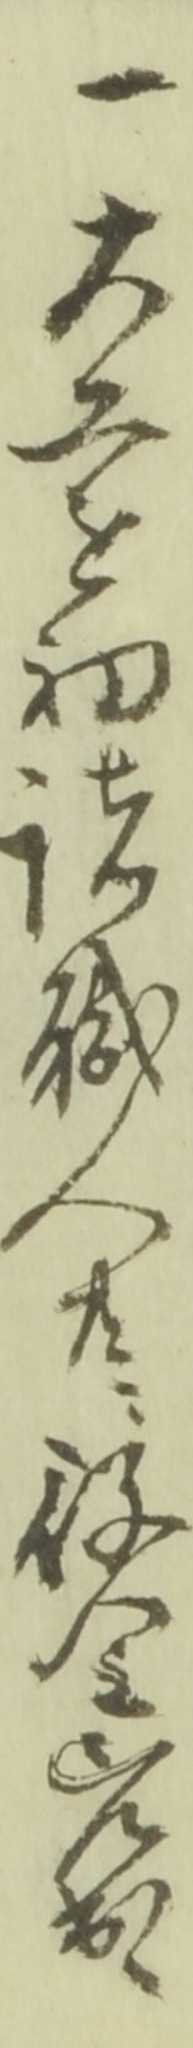一大工を初諸職人共二役金差出し候
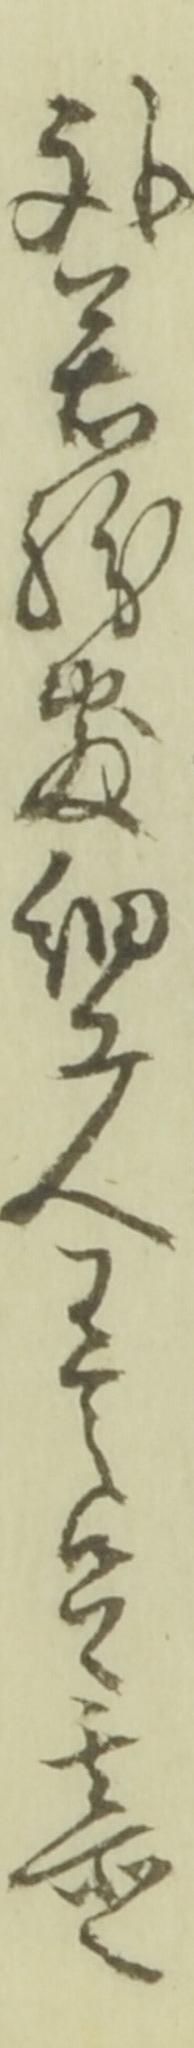外若紛敷細工人有之候覇はゝ其所之
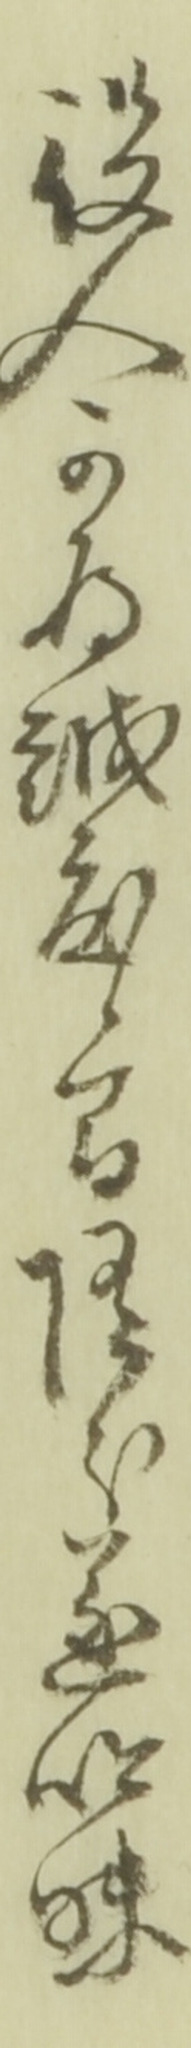役人可為誠度候間随分遂吟味
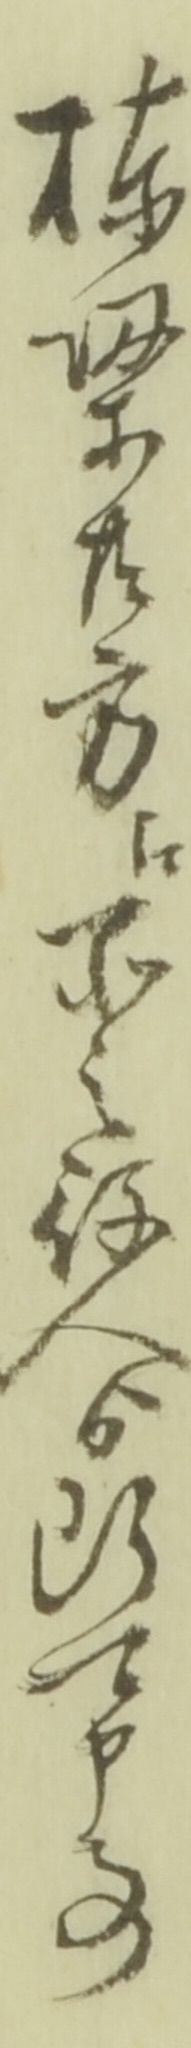棟梁共方え所々役人より可申事
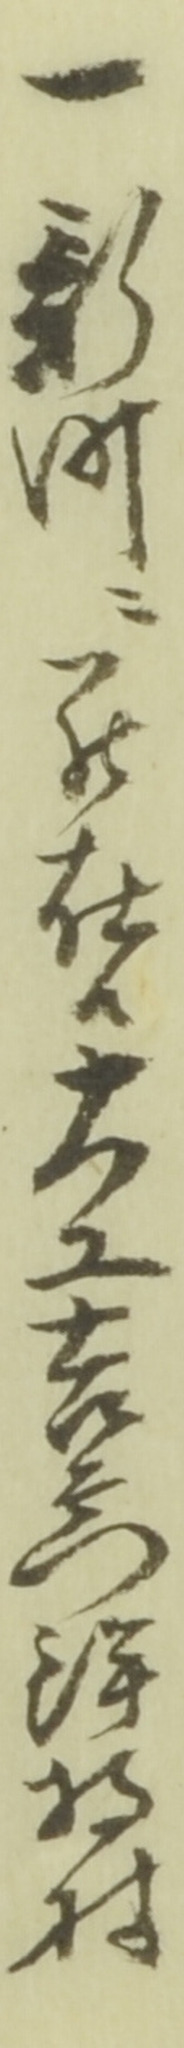一新町二罷在候大工吉右衛門持村
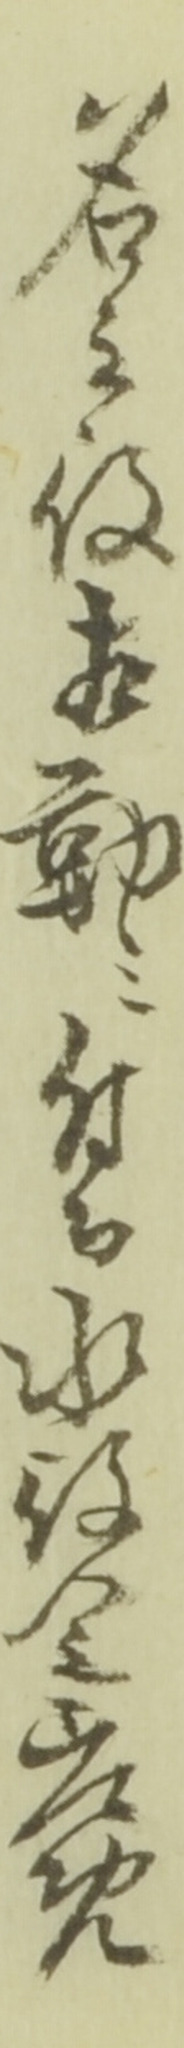名主役相勤め候二付而水役金差免
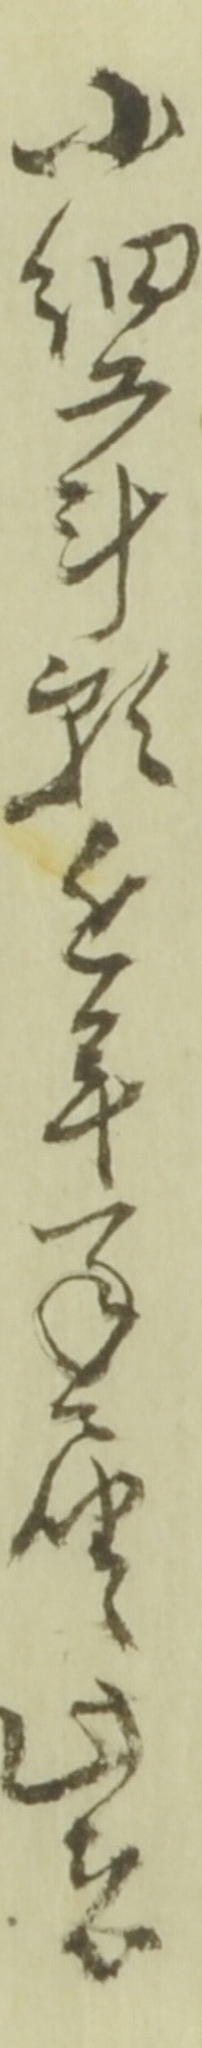小細工斗願を承届候此者
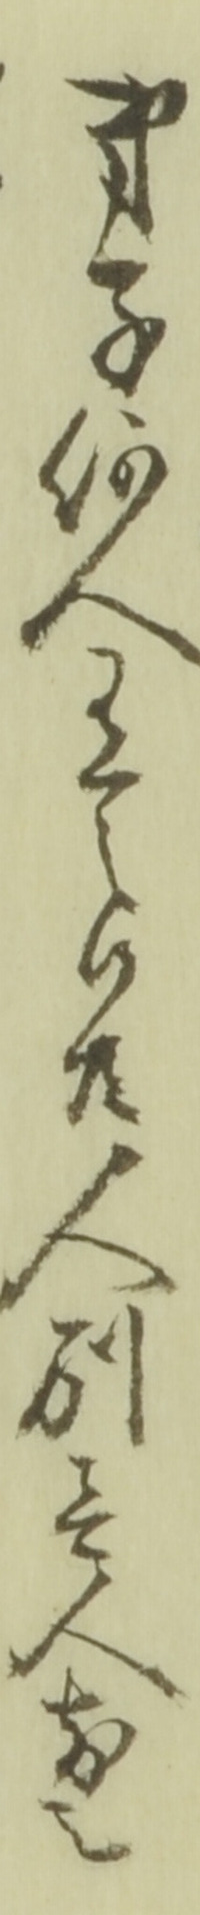弟子何人有之候共人別壱人前之
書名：御公儀様御領主様御触書控
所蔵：伊那市立高遠町図書館・合同会社AMANE
